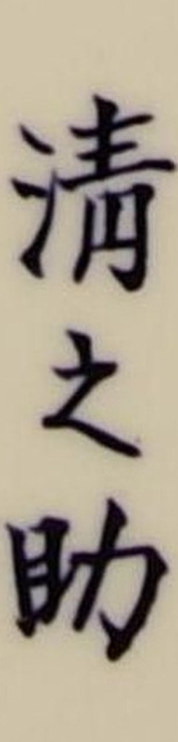清之助
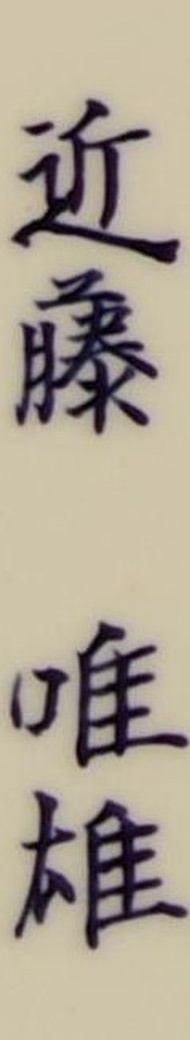近藤唯雄
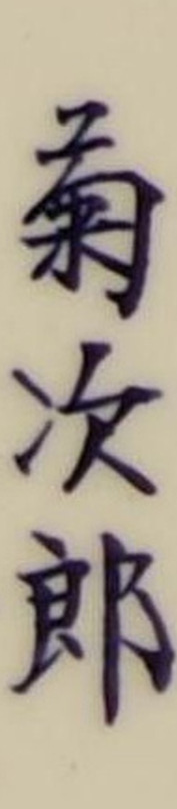菊次郎

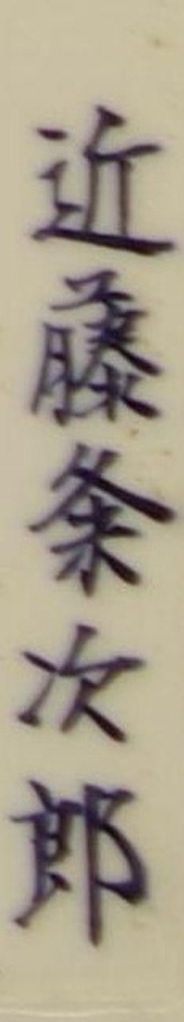近藤粂次郎
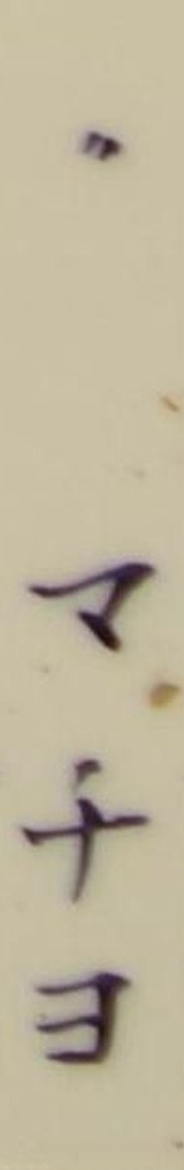マチヨ
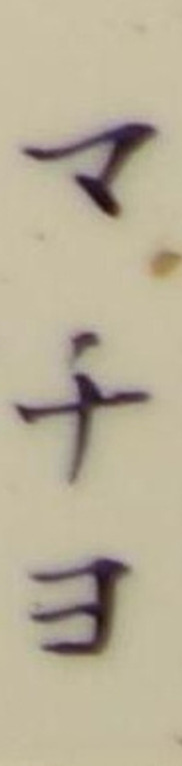マチヨ
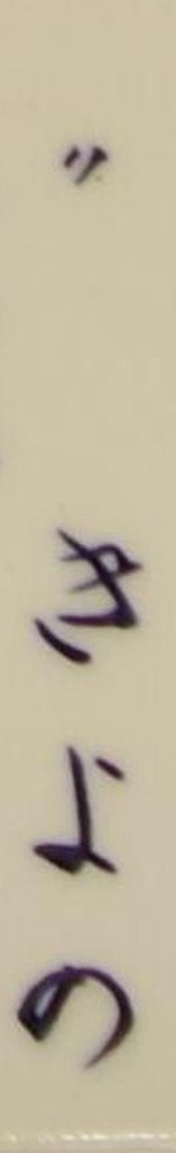きよの
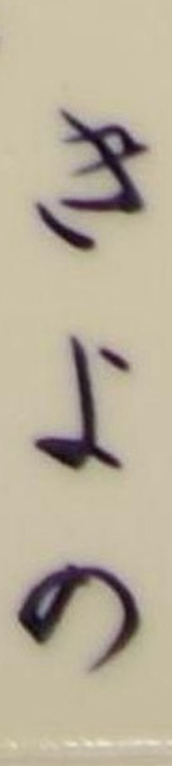きよの
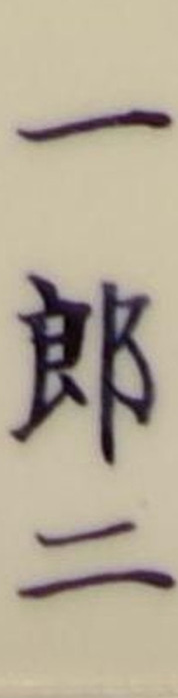一郎二
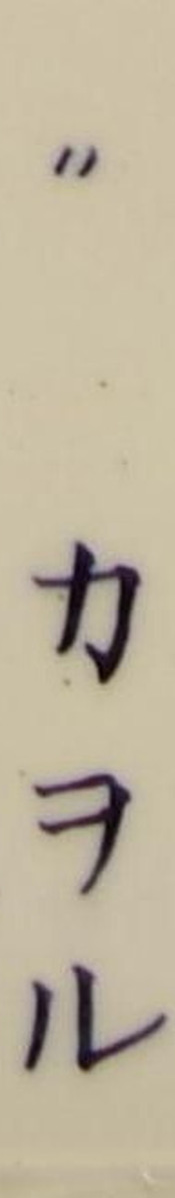カヲル
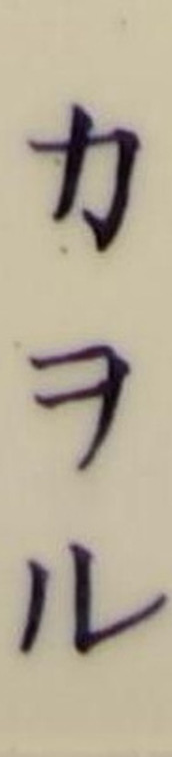カヲル
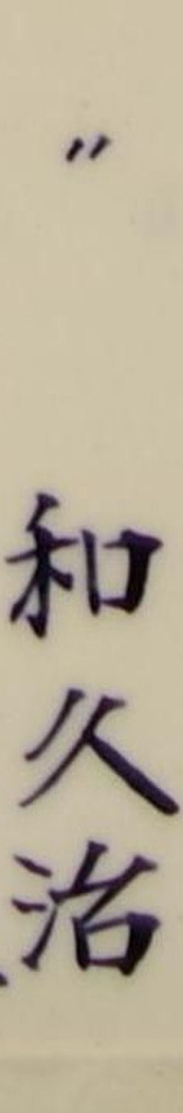和久治
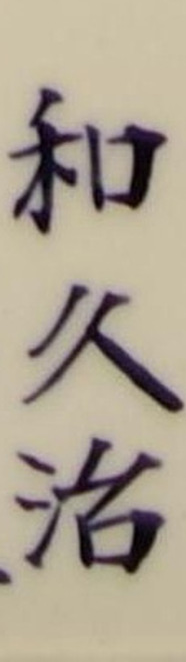和久治
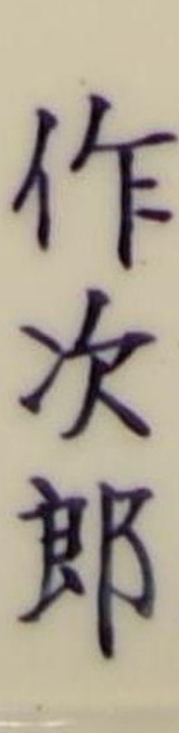作次郎
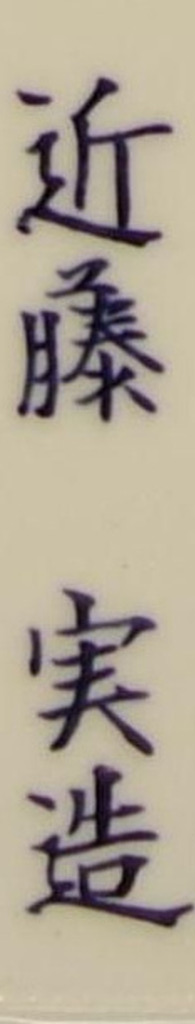近藤実造
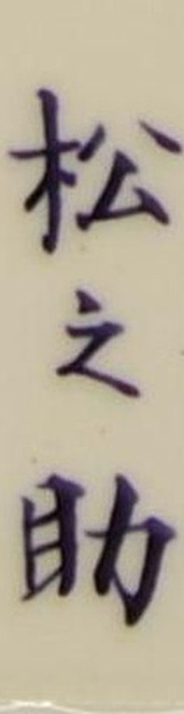松之助
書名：E~L
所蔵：高野山金剛峯寺
